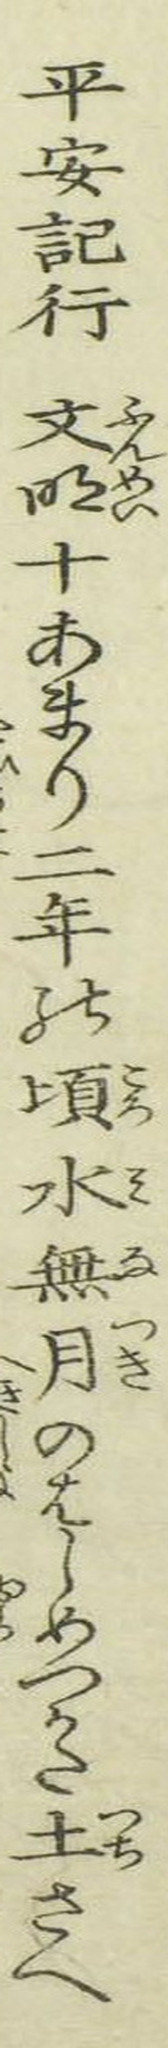平安記行文明十あまり二年の頃水無月のはしめつかた土さへ
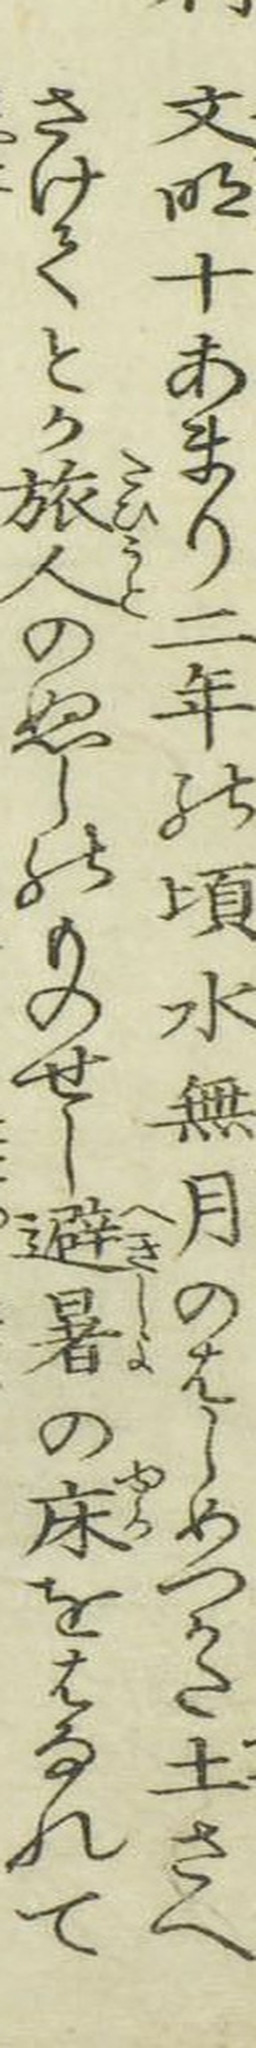さけてとか旅人のぬしのものせし避暑の床をはなれて
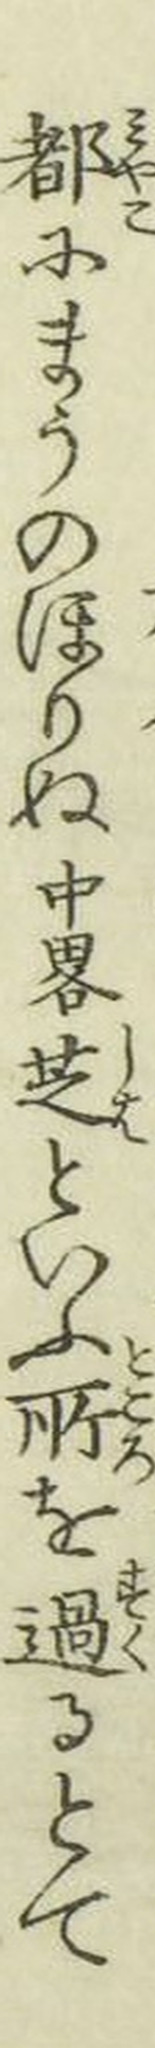都にまうのほりぬ中略芝といふ所を過るとて
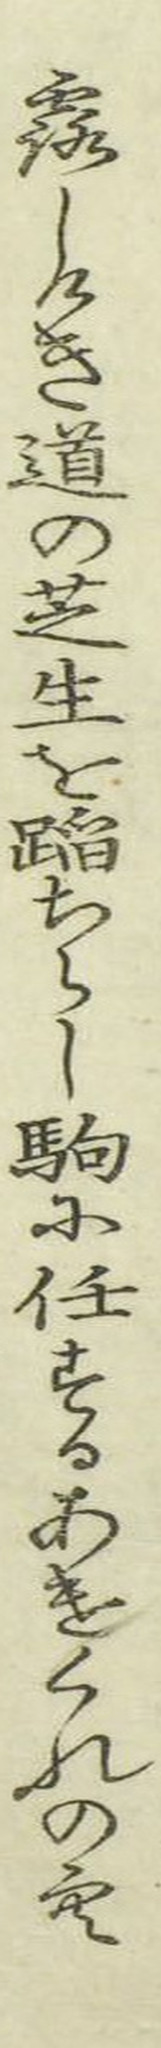露しけき道の芝生を踏ちらし駒に任するあけくれの空太田道灌
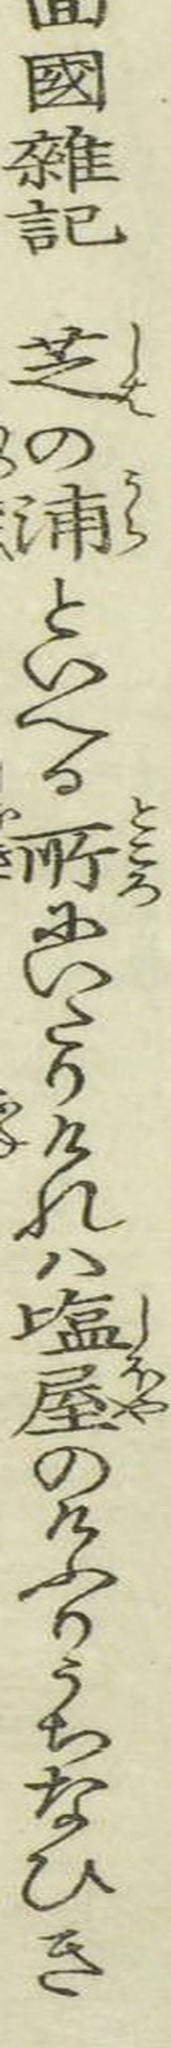回國雑記芝の浦といへる所にいたりけれは塩屋のけふりうちなひき
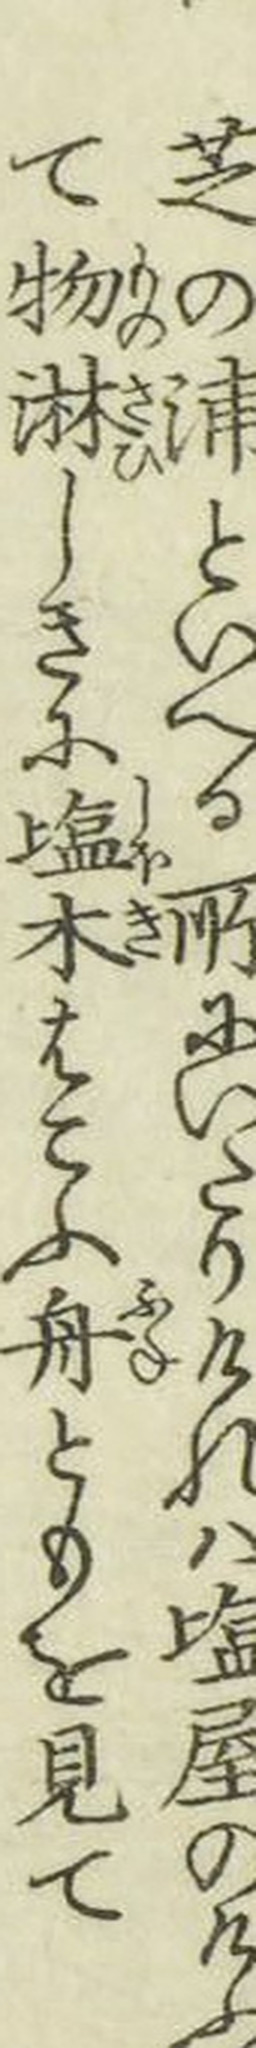て物淋しきに塩木はこふ舟ともを見て
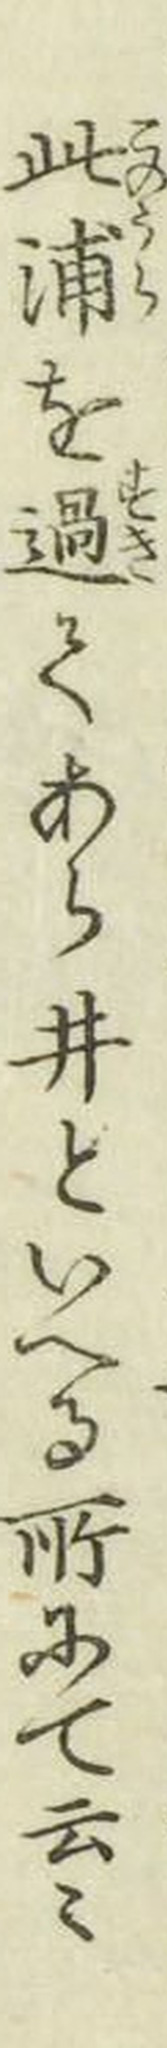此浦を過てあら井といへる所にて云々
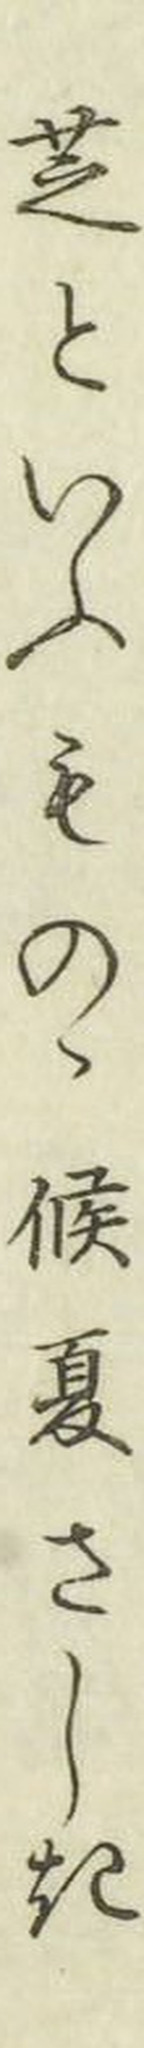芝といふものゝ候夏さしき梅翁
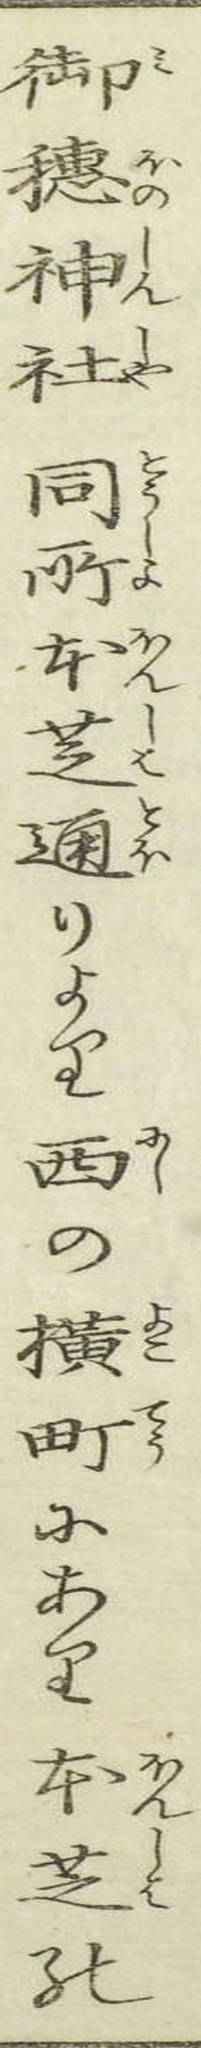御穂神社同所本芝通りより西の横町にあり本芝の
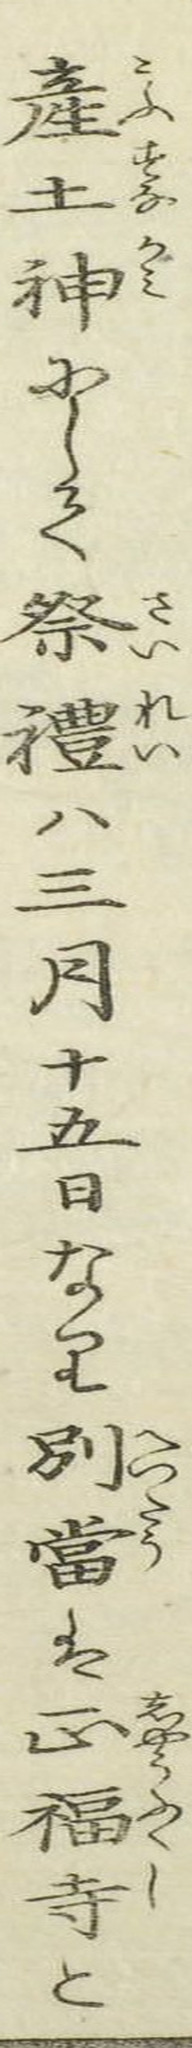産土神にして祭禮は三月十五日なり別當は正福寺と
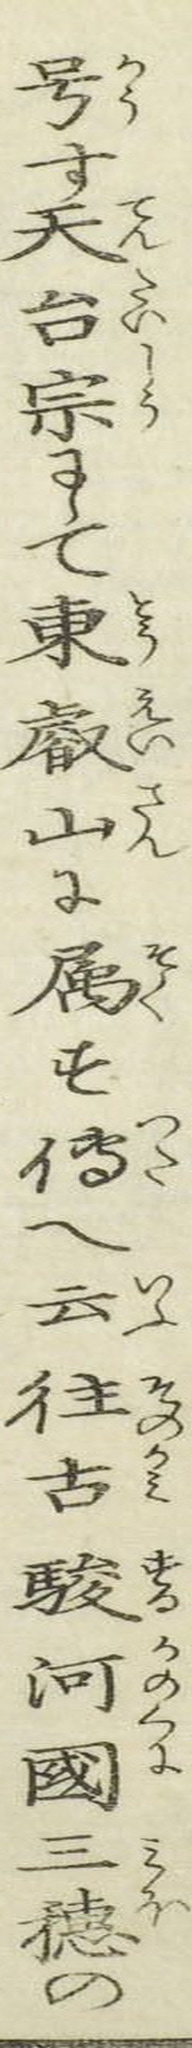号す天台宗にて東叡山に属す傳へ云往古駿河國三穂の
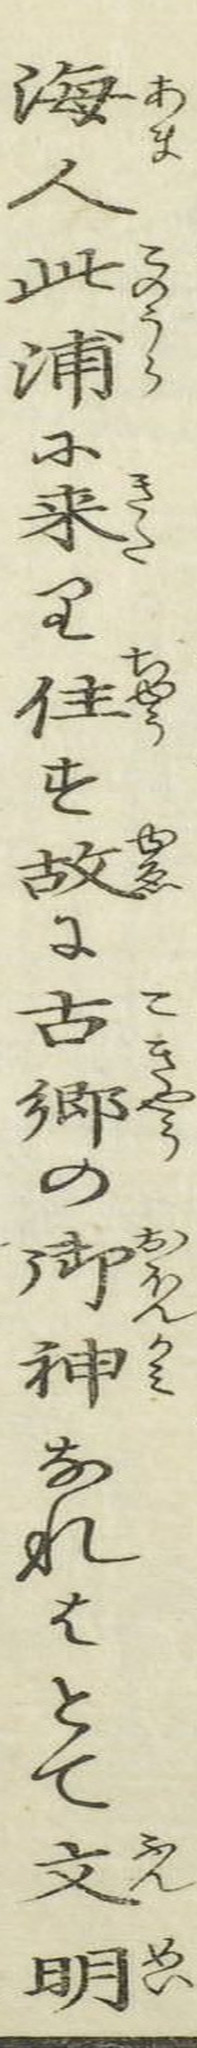海人此浦に来り住す故に古郷の御神なれはとて文明
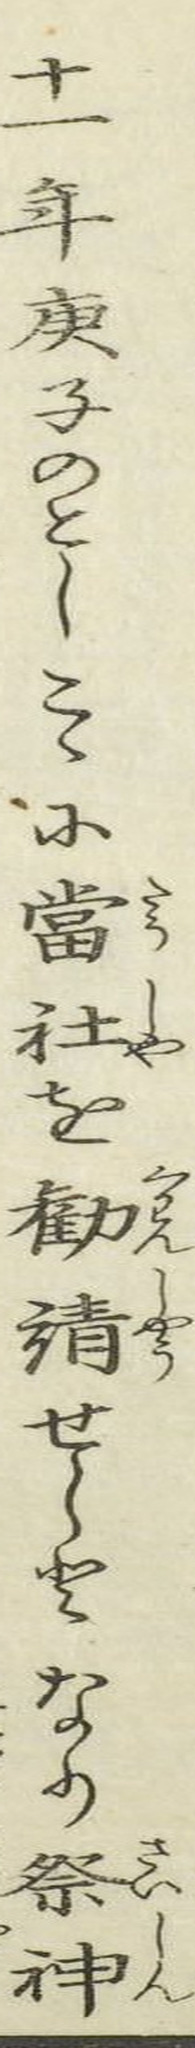十一年庚子のとしこゝに當社を勧請せしとなり祭神
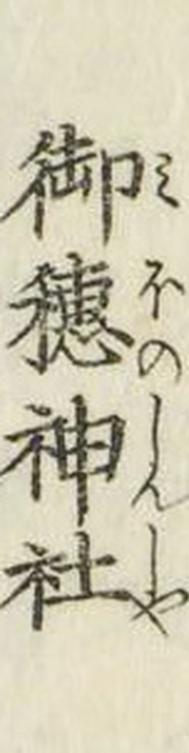御穂神社
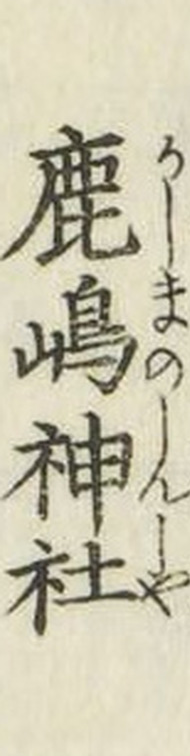鹿島神社
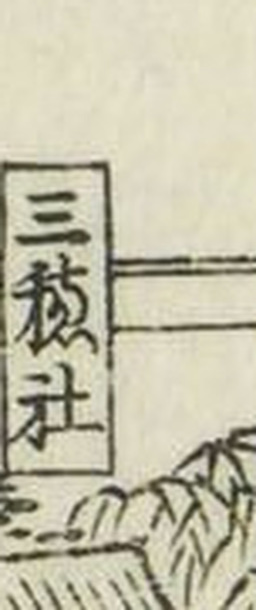三穂社
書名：江戸名所図会 20巻 巻之3
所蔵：東京学芸大学教育コンテンツアーカイブ
